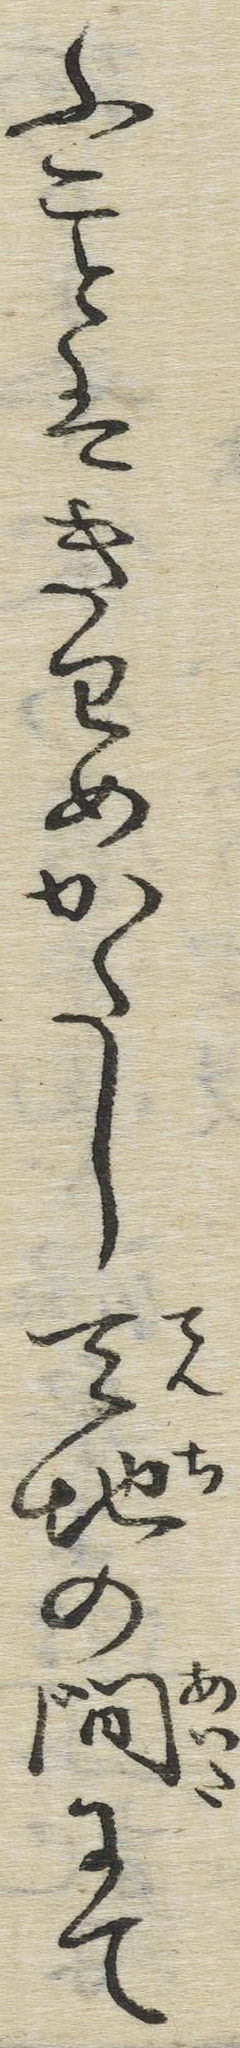ふことはきわめかたし天地の間にて
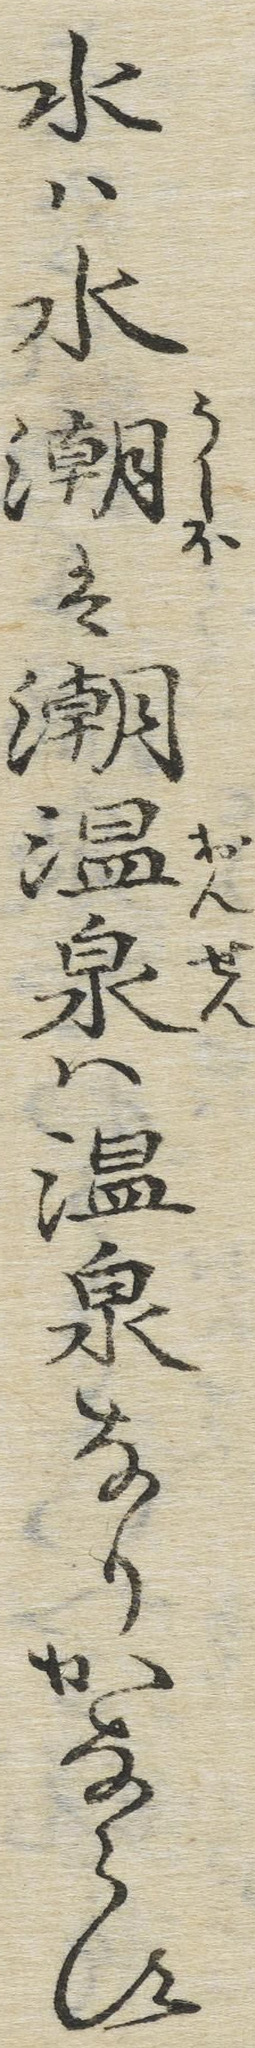水は水潮は潮温泉は温泉なりかならす
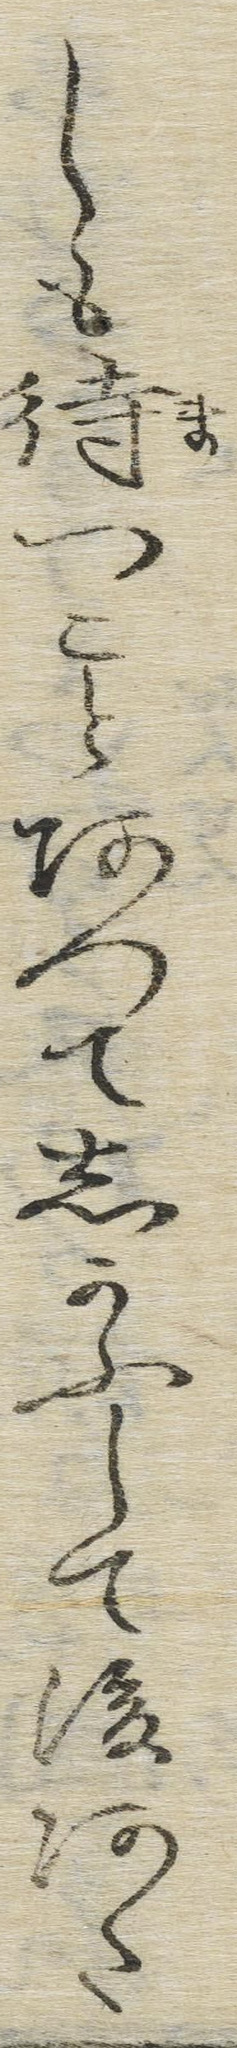しも待つことあつてしかふして後あた
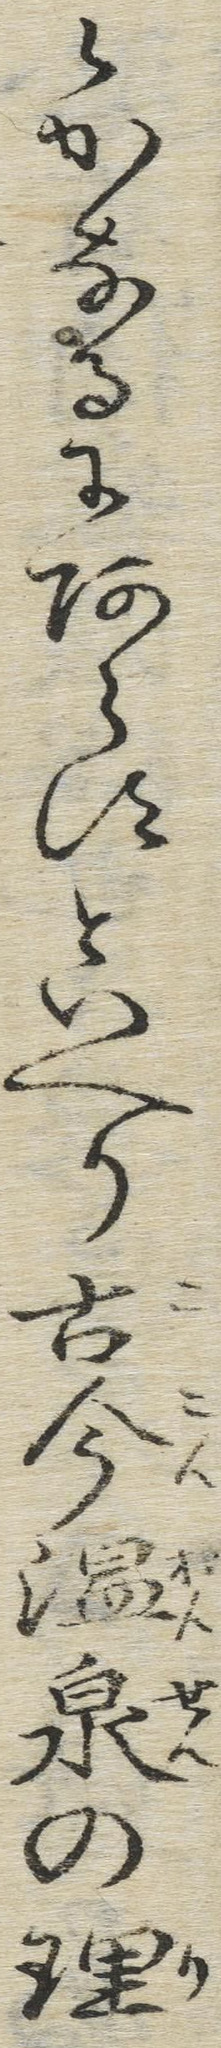ゝかなるにあらすといへり古今温泉の理
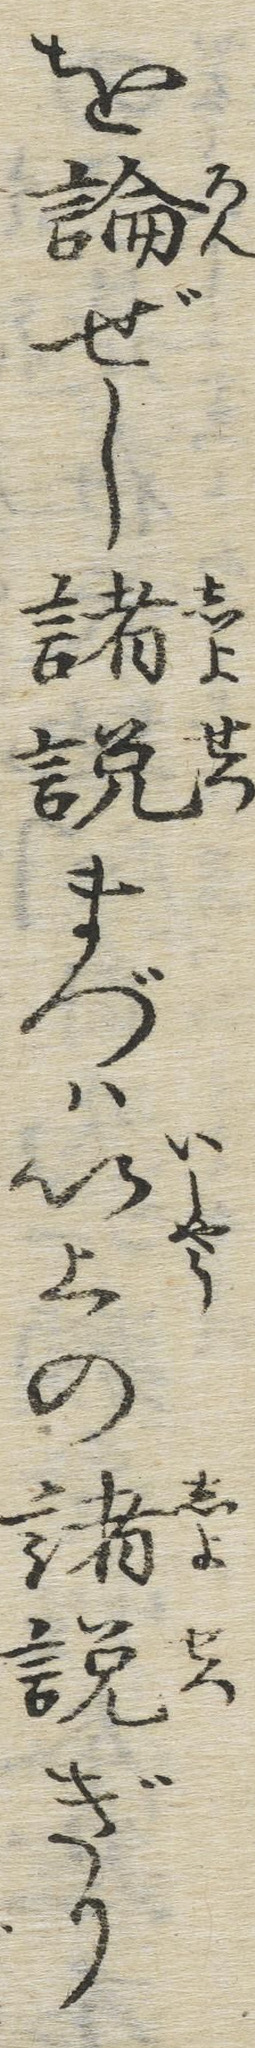を論ぜし諸説まづは以上の諸説ぎり
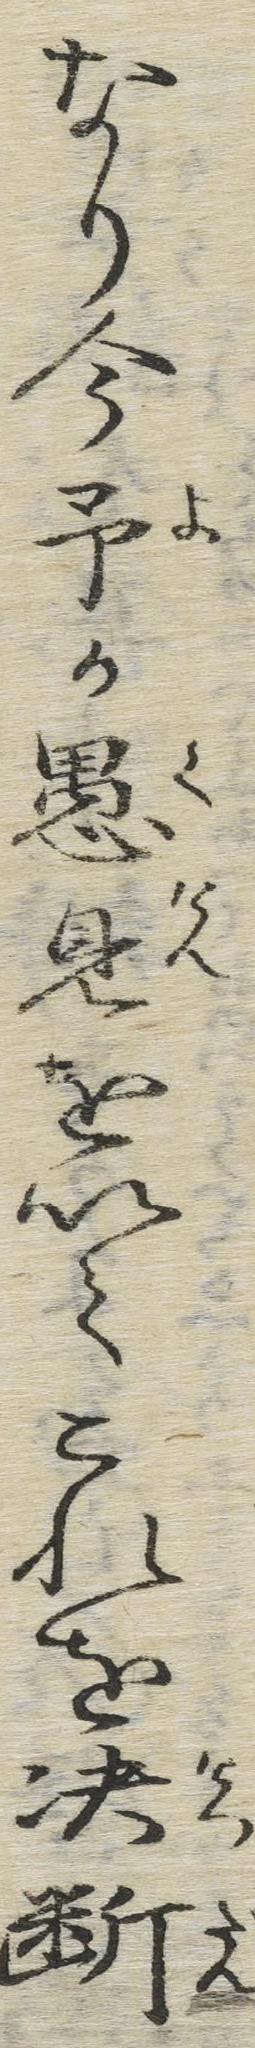なり今予か愚見を以てこれを決断
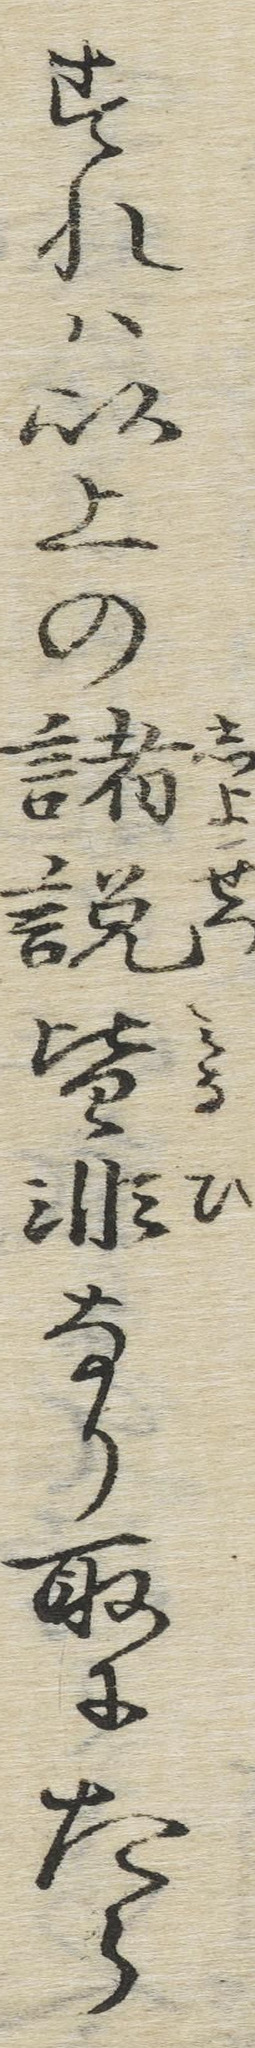すれは以上の諸説皆非なり取にたら
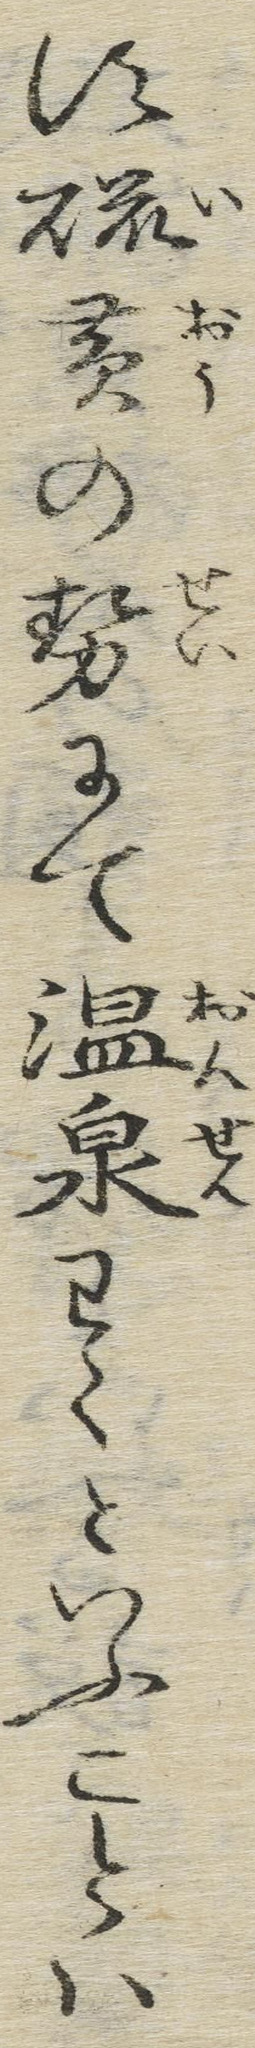す硫黄の勢にて温泉わくといふことは
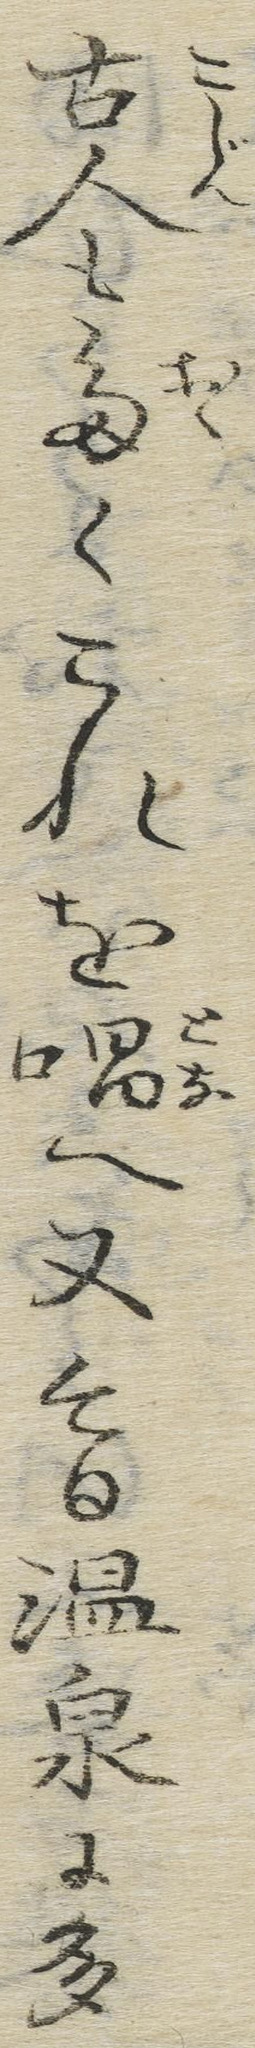古人も多くこれを唱へ又今日温泉に多
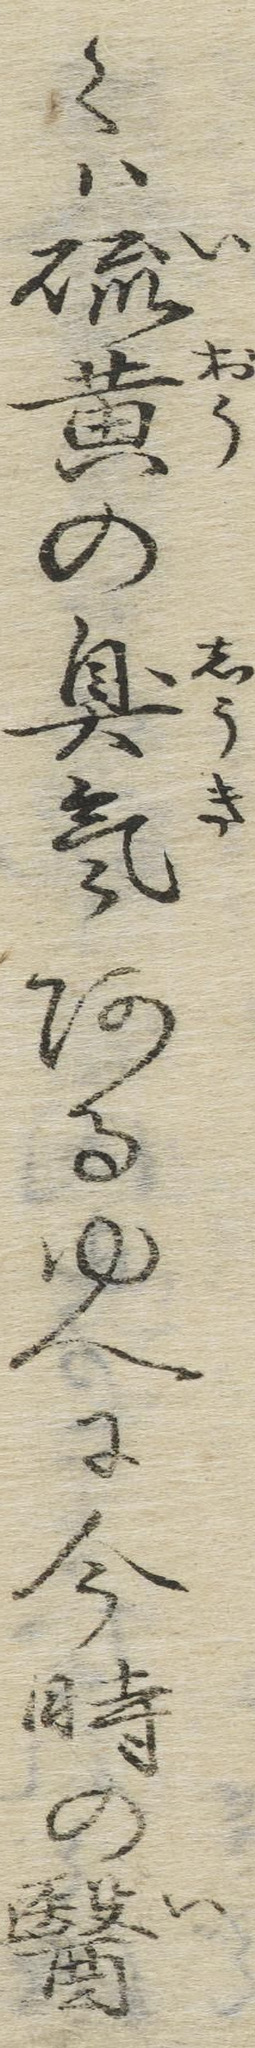くは硫黄の臭気あるゆへに今時の医
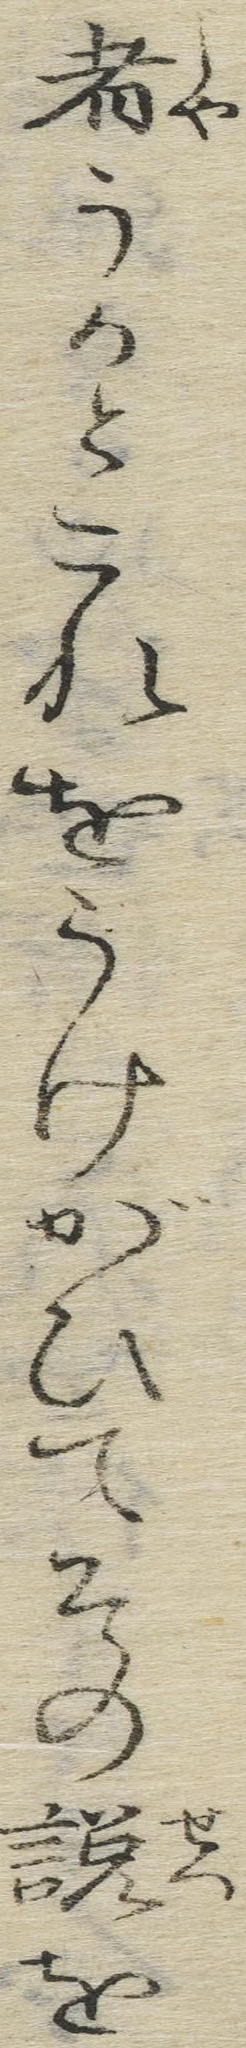者うかとこれをうけがひてその説を

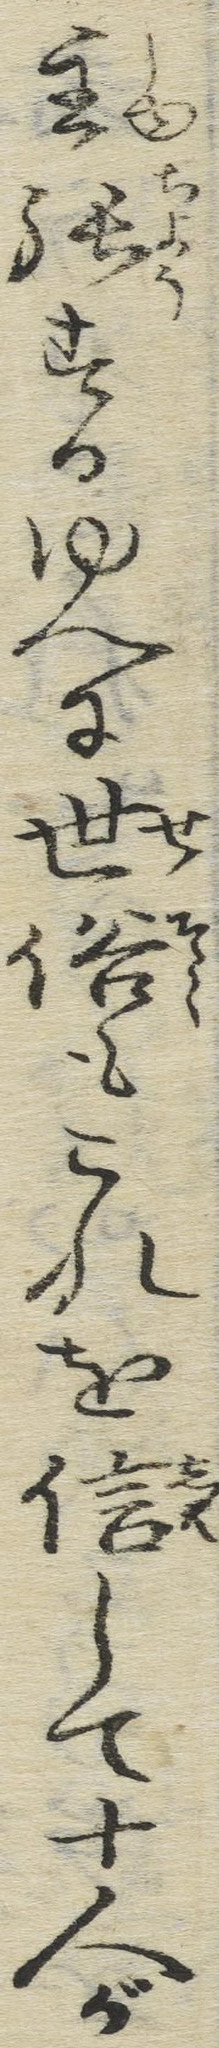主張するゆへに世俗もこれを信して十人が
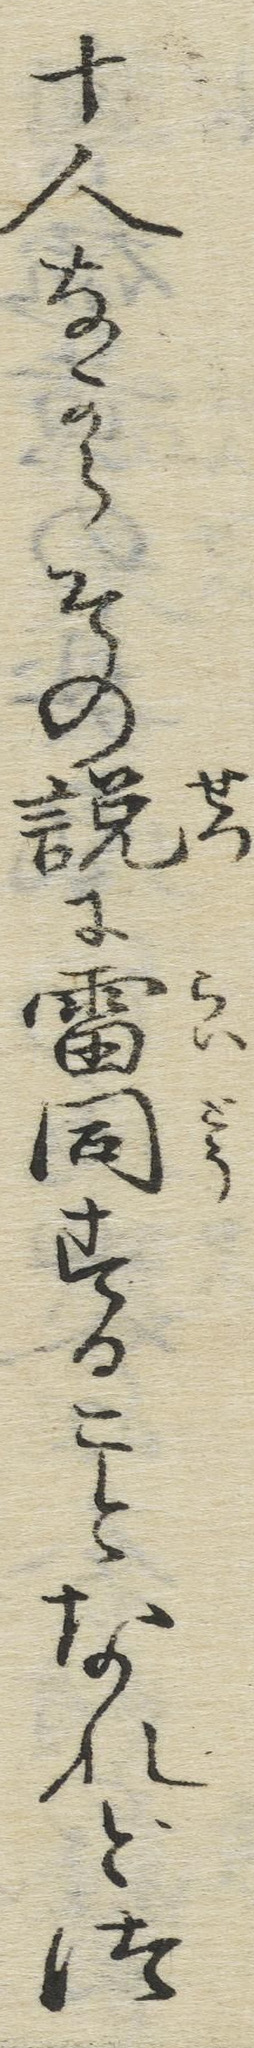十人なからその説に雷同することなれどつ
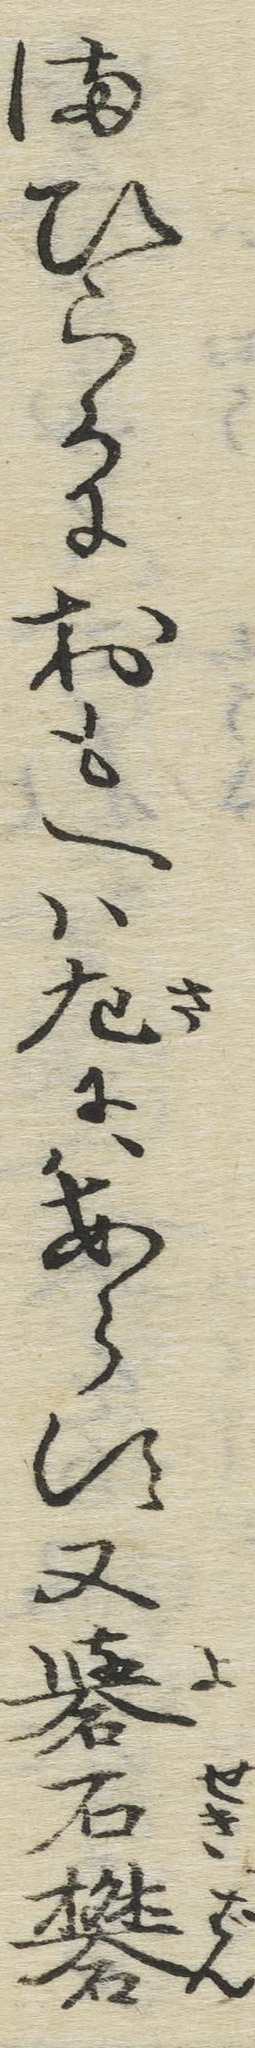まひらかにおもへは左にはあらす又礜石礬
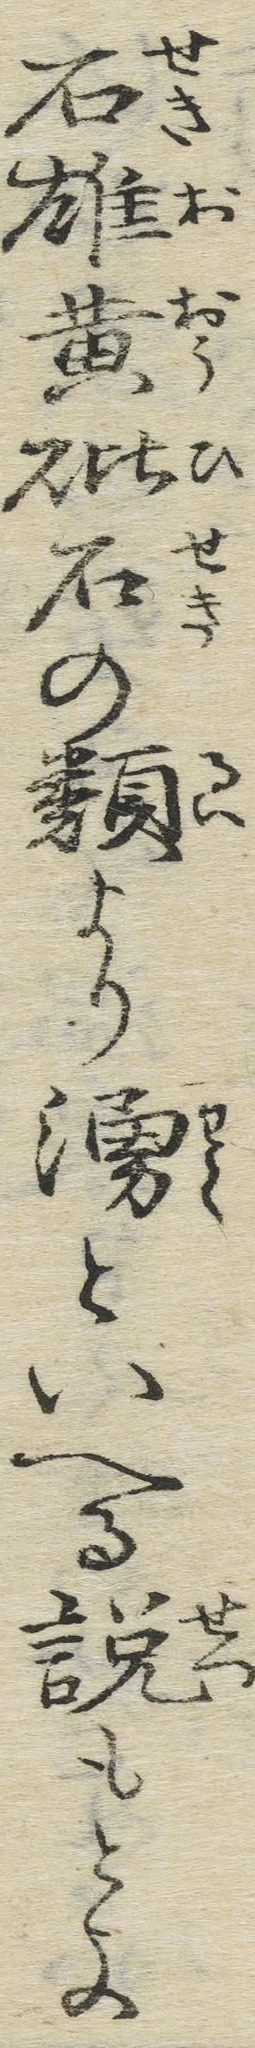石雄黄砒石の類より湧といへる説もとよ
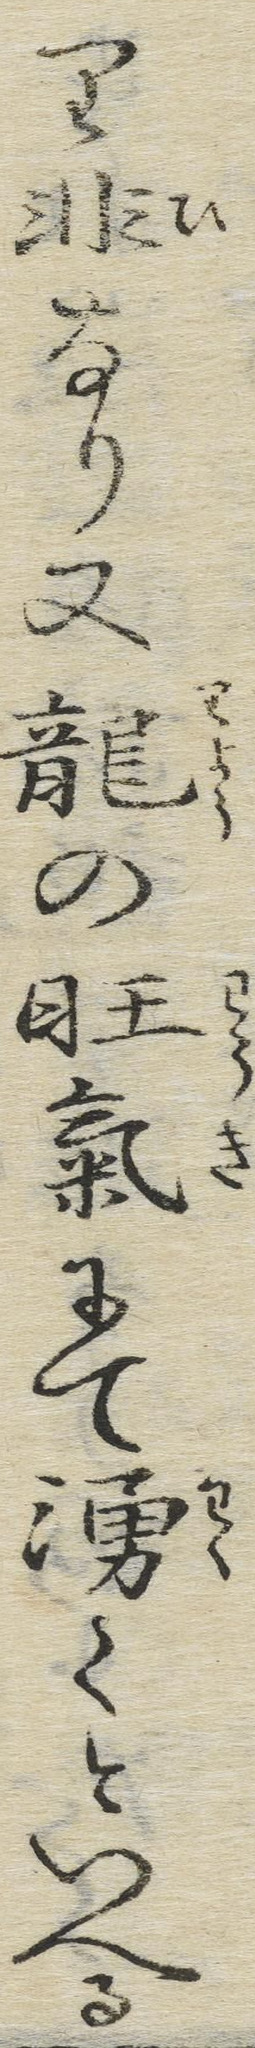り非なり又龍の旺気にて湧くといへる
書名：温泉考
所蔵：東京大学地震研究所図書室 Earthquake Research Institute Library, The University of Tokyo, JAPAN
